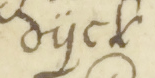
dijck
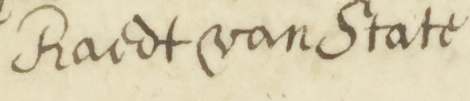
Raedt van State
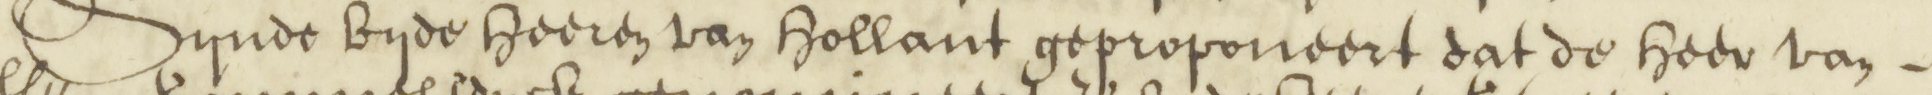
Synde byde heeren van Hollant geproponeert dat de heer van
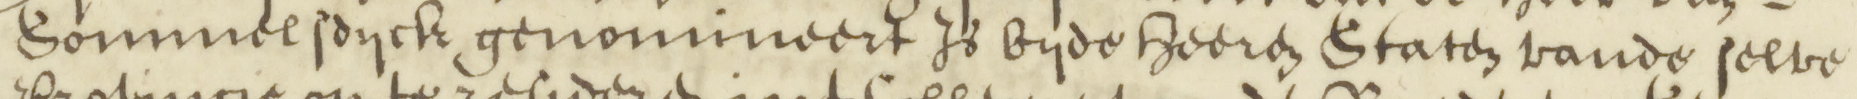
Sommelsdyck genomineert Is byde heeren Staten vande selve
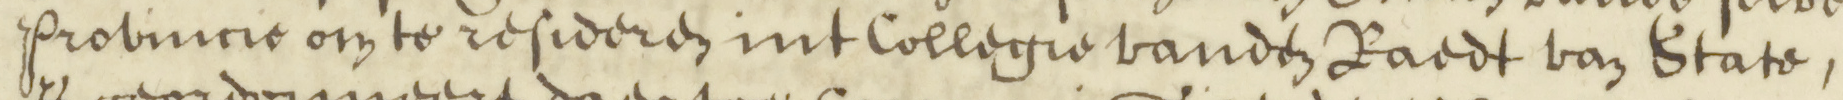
Provincie om te resideren int Collegie vanden Raedt van State.
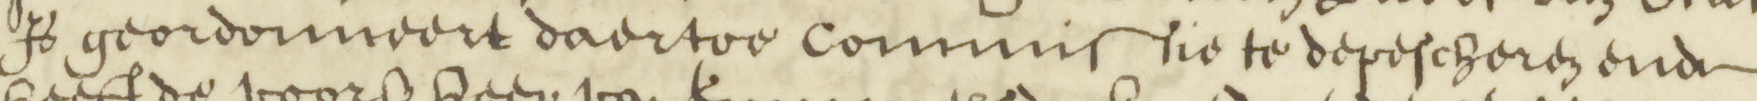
Is geordonneert daertoe commissie te depescheren ende
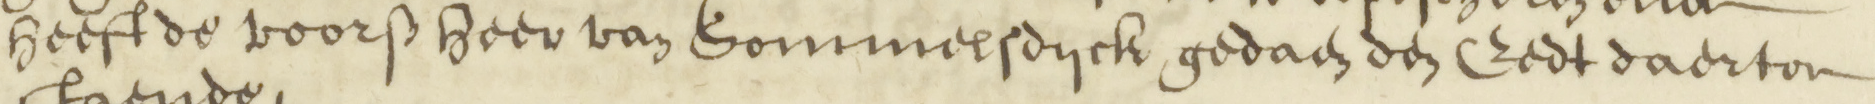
heeft de voors heer van Sommelsdyck gedaen den Eedt daertoe
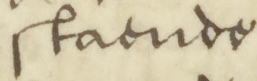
staende.
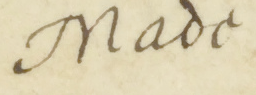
Made
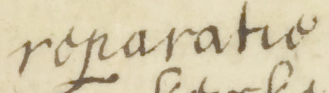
reparatie
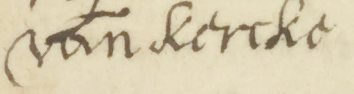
van kercke
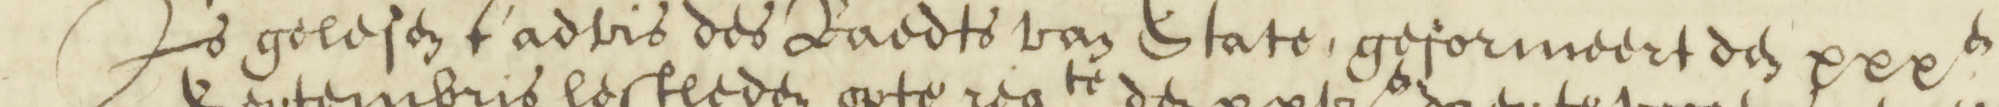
Is gelesen t'advis des Raedts van State, geformeert den xxxen.
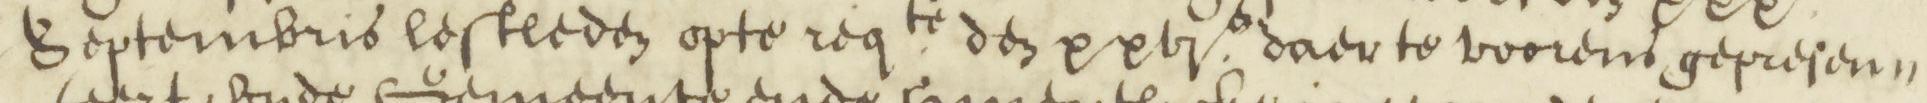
Septembris lestleden opte reqte. den xxvien. daer te voorens gepresen„
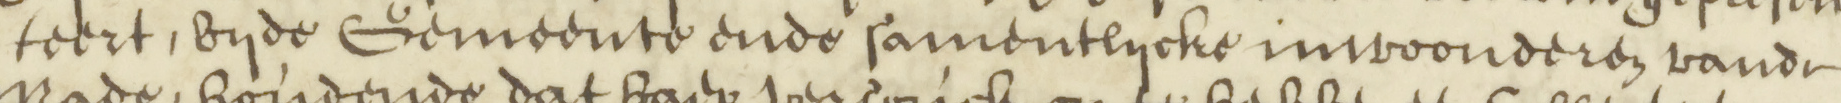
teert, byde Gemeente ende samentlycke inwoonderen vande
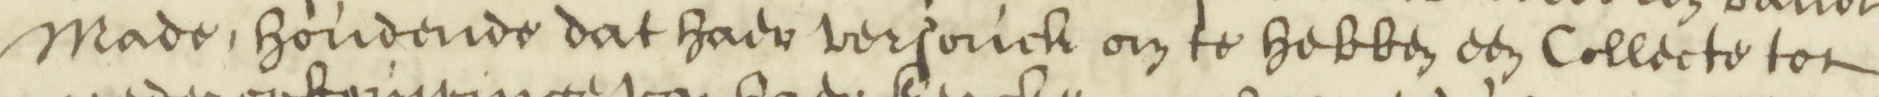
Made, houdende dat haer versouck om te hebben een Collecte tot
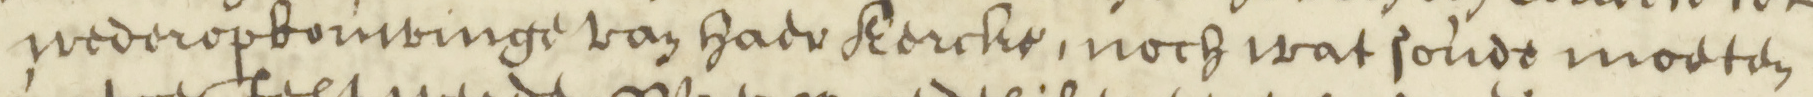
wederopbouwinge van haer Kercke, noch wat soude moeten
